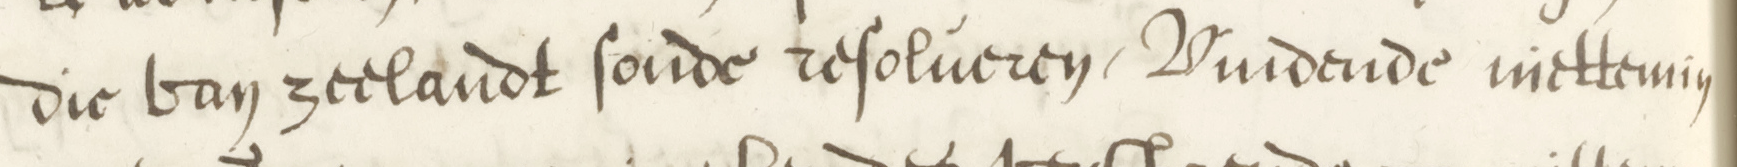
die van zeelandt soude resolueren, Vindende niettemin
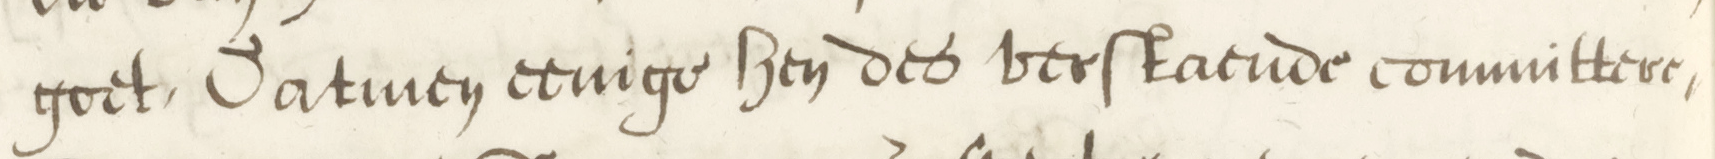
goet, datmen eenige hen des verstaende committere,
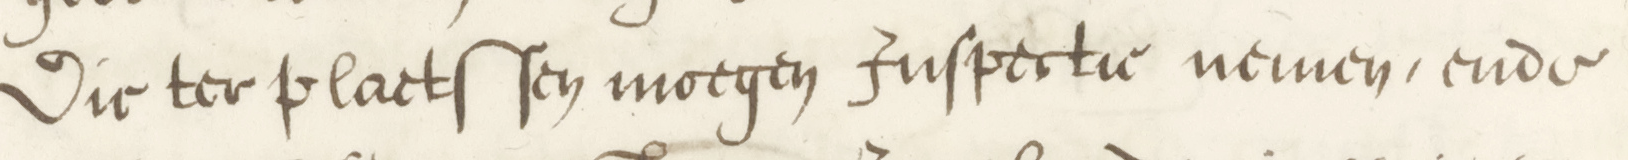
Die ter plaetssen moegen Inspectie nemen, ende
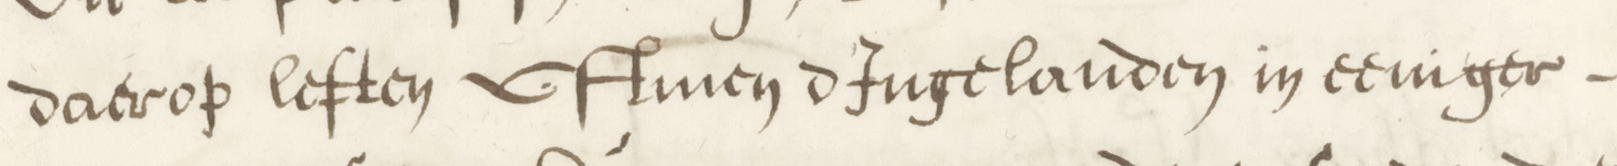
daerop leften Oftmen d'Ingelanden in eeniger
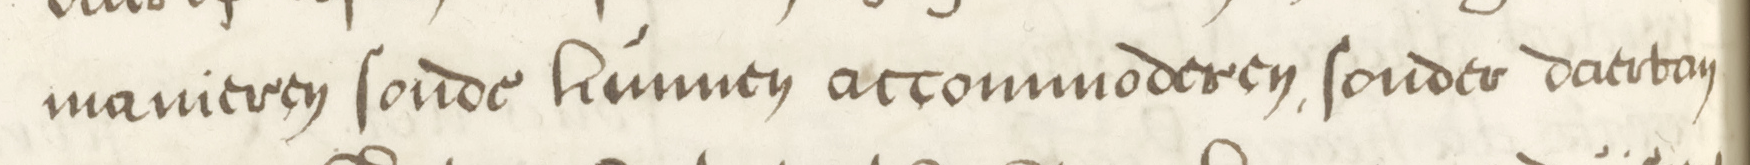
manieren soude kunnen accommoderen, sonder daervan
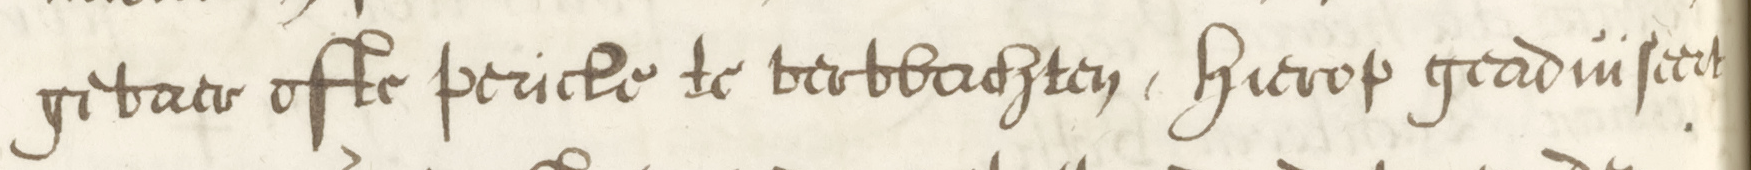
gevaer ofte pericle te verwachten. hierop geaduiseert
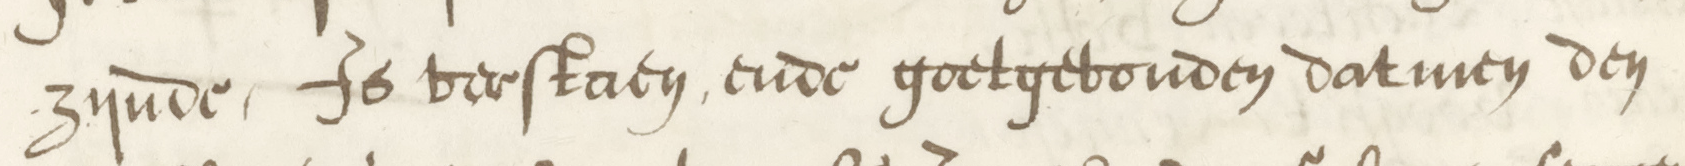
zynde, Is verstaen, ende goetgevonden dat men den
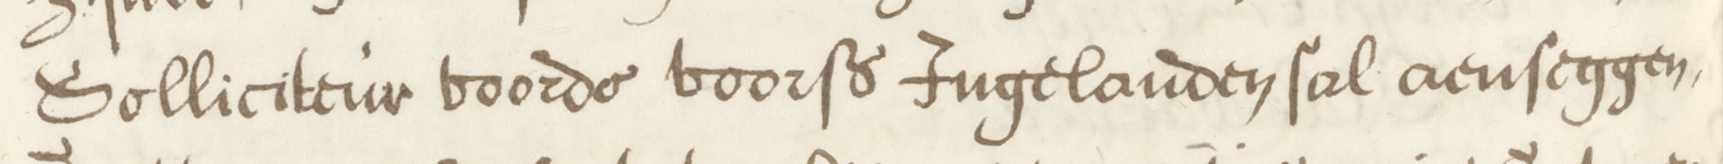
Solliciteur voorde voors Ingelanden sal aenseggen,
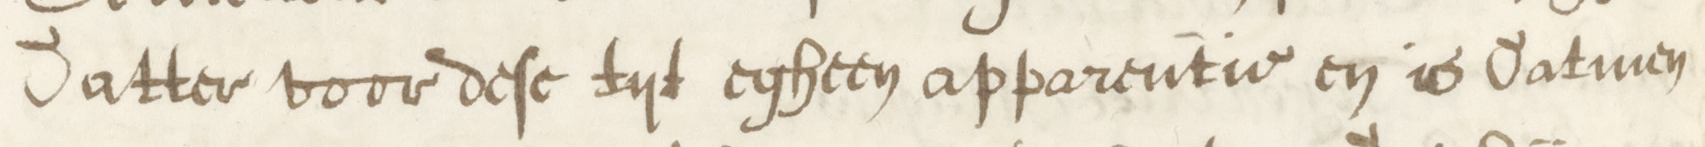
datter voor dese tyt egheen apparentie en is datmen
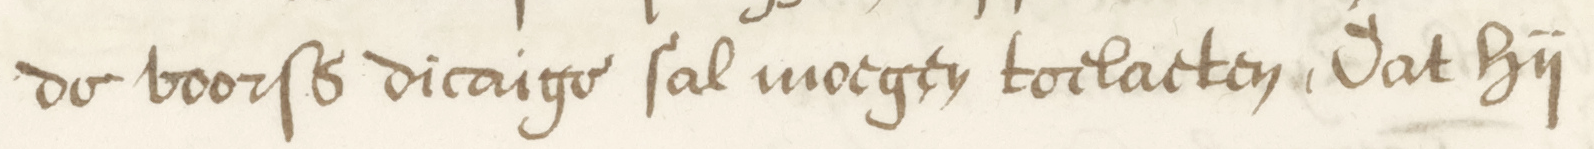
de voors dicaige sal moegen toelaeten, dat hij
